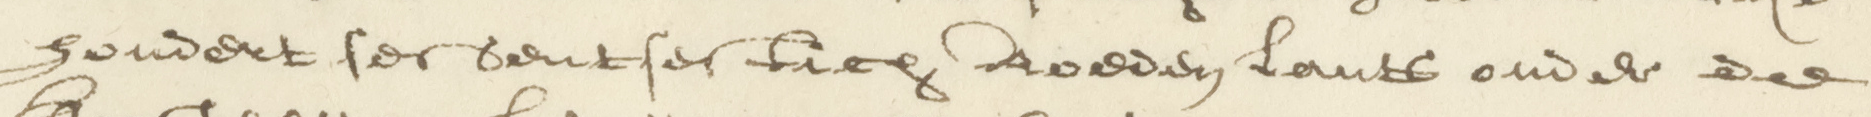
hondert sessentsestich Roeden Lants onder de
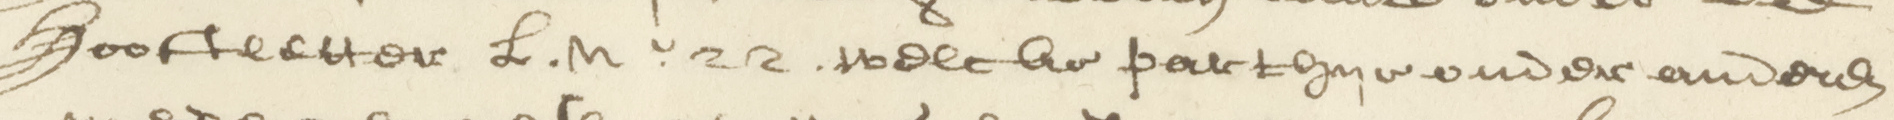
Hooftletter L. Nr. 22. welcke parthye onder anderen
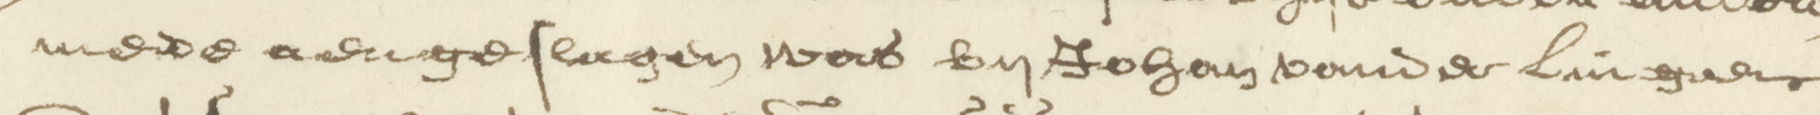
mede aengeslagen was by Johan vander Lingen
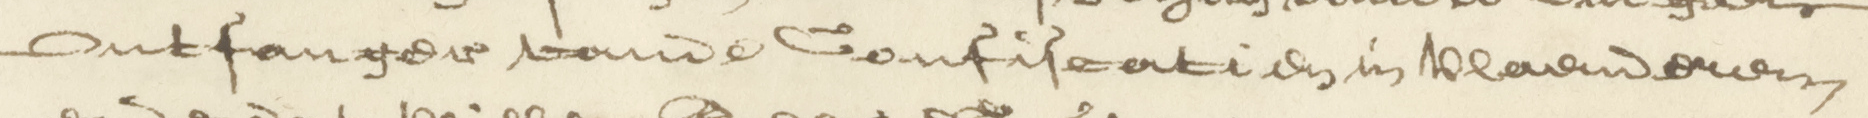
Ontfanger vande Confiscatien in Vlaenderen,
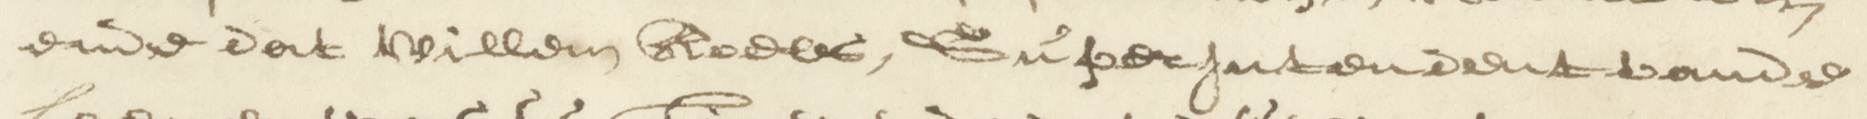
ende dat Willem Roels, Superintendent vande
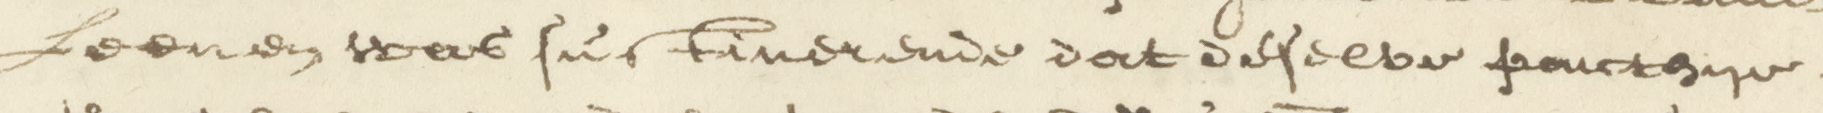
Leenen was sustinerende dat deselve parthye
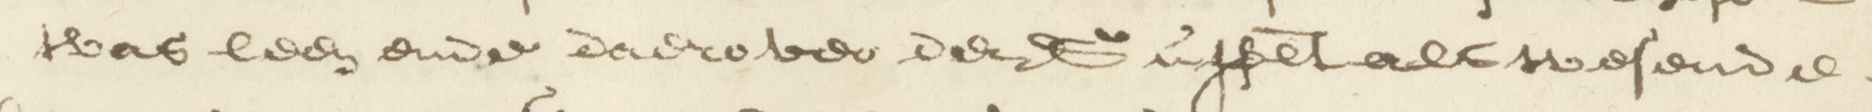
was leen ende daerover den Supplt als wesende
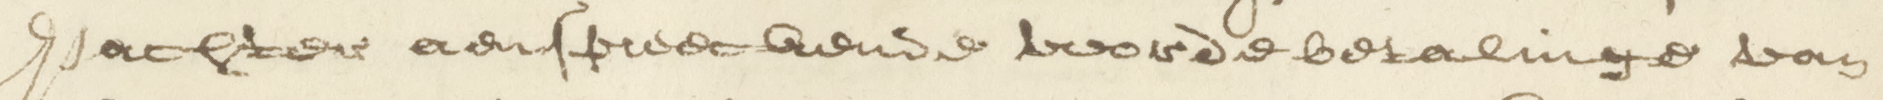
Pachter aenspreeckende voor de betalinge van
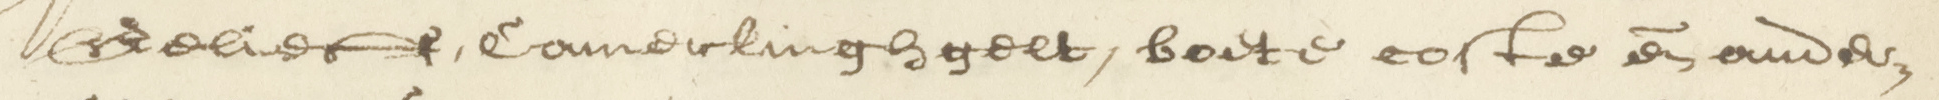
Relieff, Camerlinghgelt, boete coste en ander„
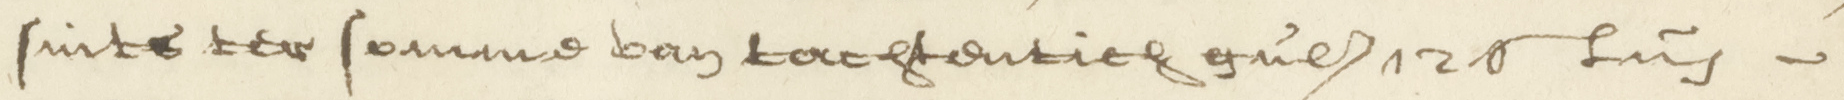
sints ter somme van tachtentich gul 12 stuv -
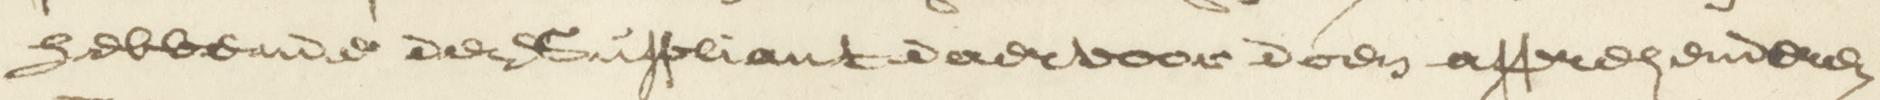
hebbende den Suppliant daervoor doen apprehenderen
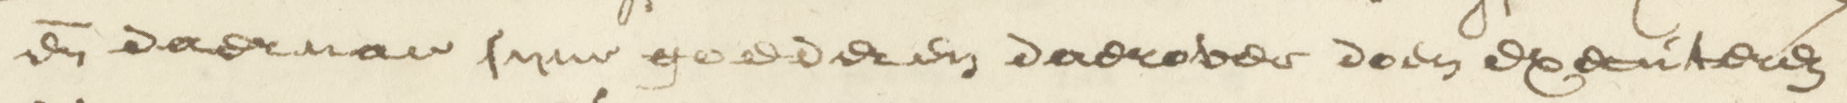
en daernae syne goederen daerover doen executeren
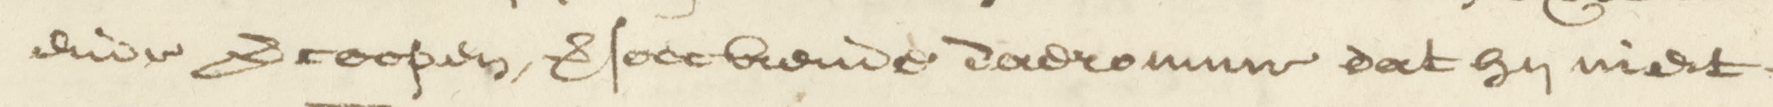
ende vcoopen, vsoeckende daeromme dat hy niet
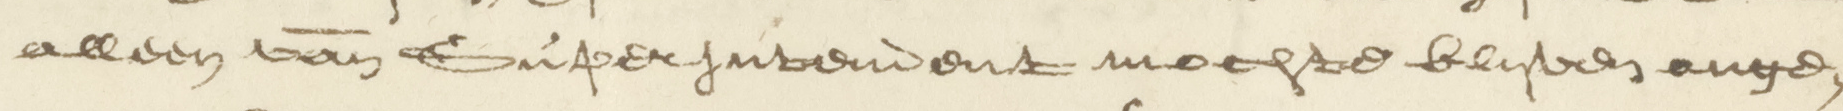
alleen van SuperIntendent mochte blyven onge,,
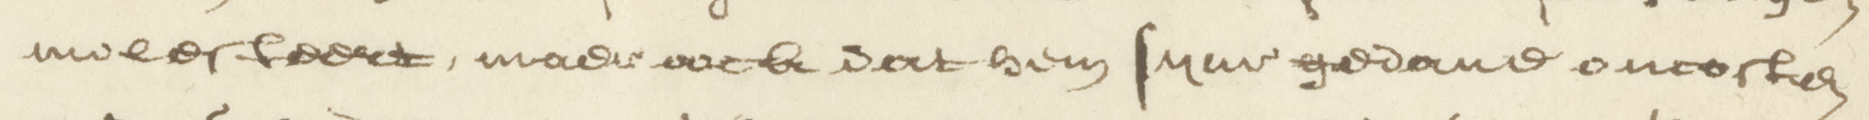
molesteert, maer oock dat hem syne gedane oncosten
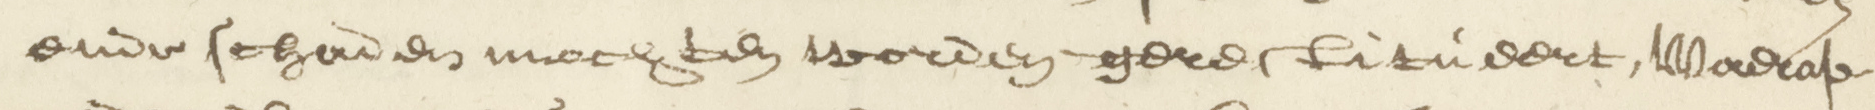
ende schaden mochten worden gerestitueert. Waerop
